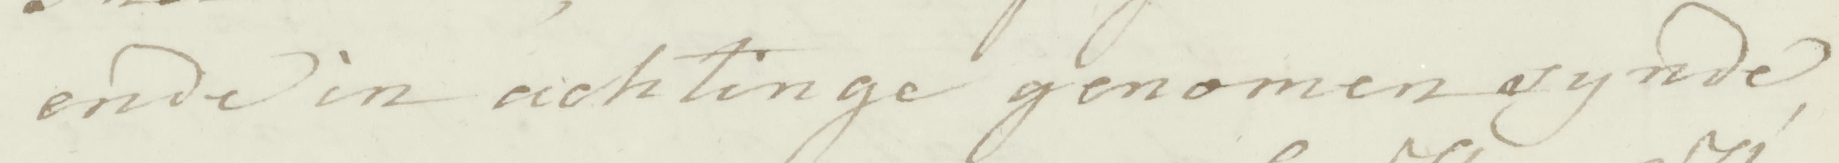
ende in achtinge genomen sijnde
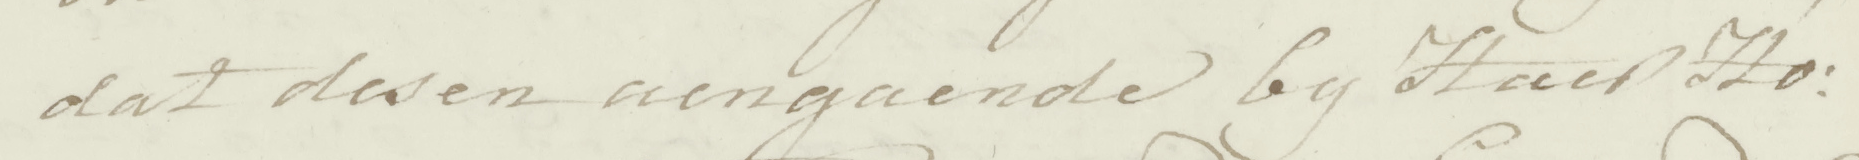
dat desen aengaende bij Haer Ho:
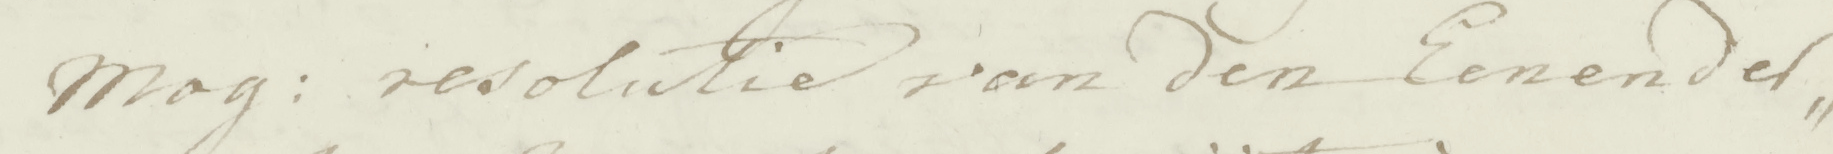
Mog: resolutie van den Eenender„
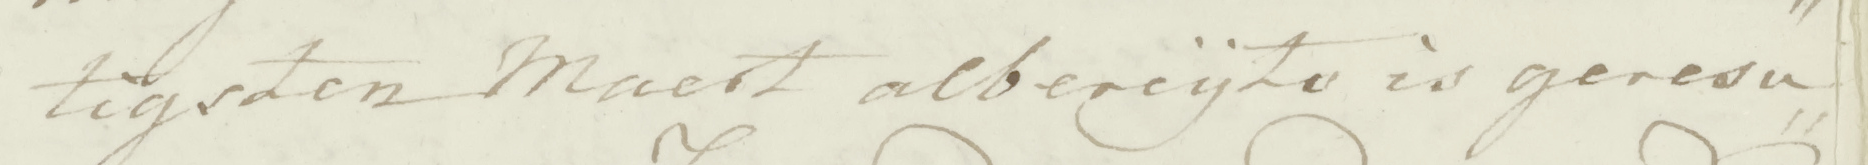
tigsten Maert albereijts is geresu„
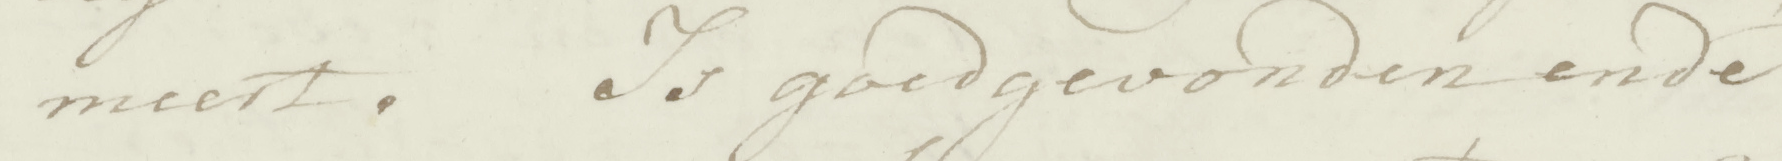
meert. Is goedgevonden ende
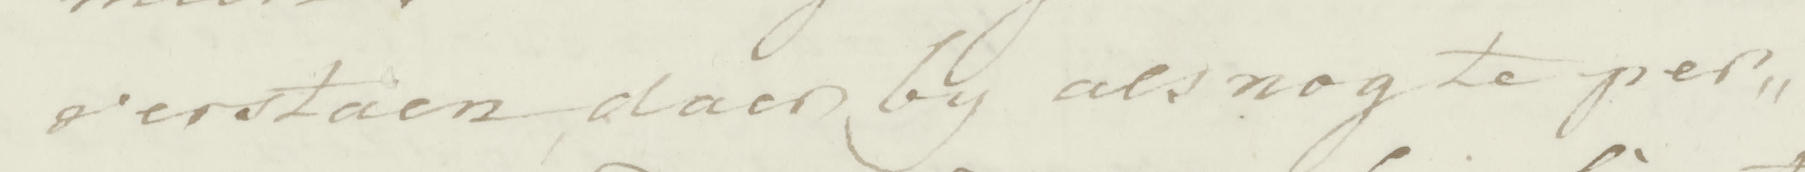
verstaen daer bij als nog te per„
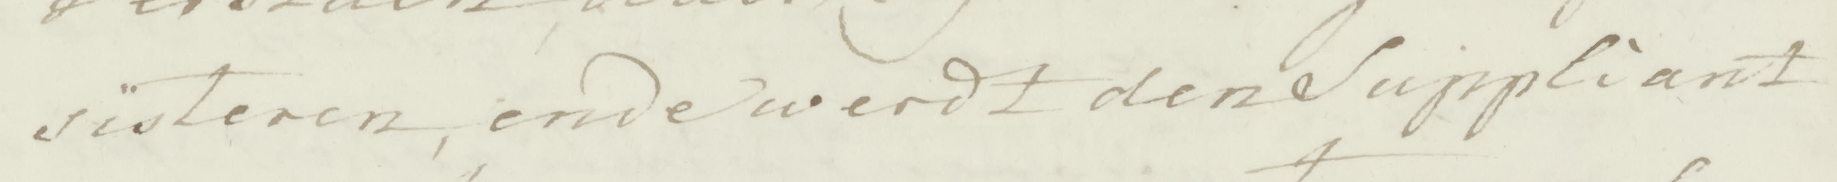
sisteren, ende werdt den Suppliant
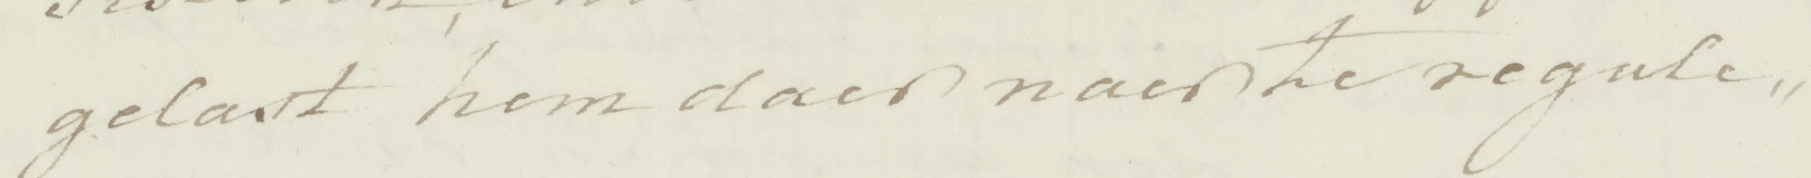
gelast hem daer naer te regule„
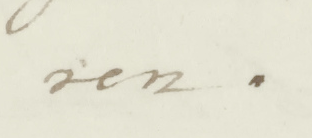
ren.
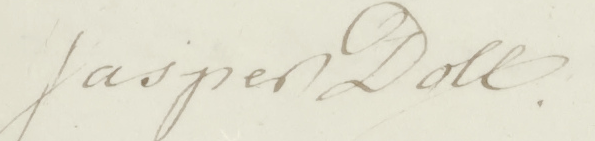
Jasper Doll.
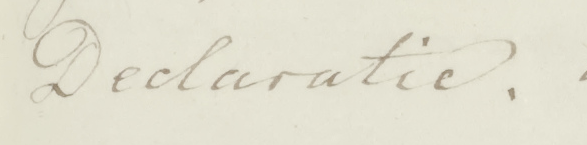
Declaratie
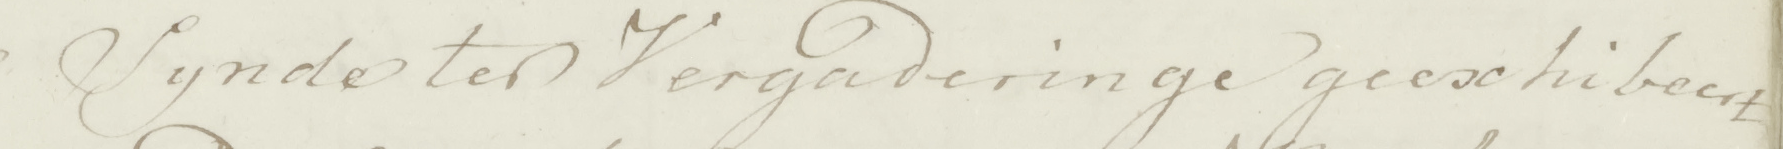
Sijnde ter Vergaderinge geexhibeert
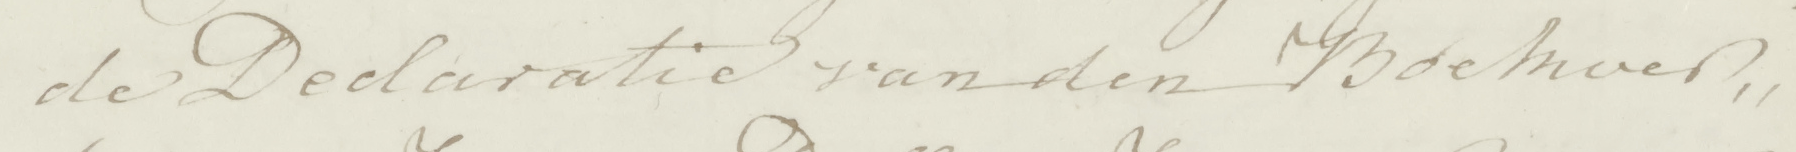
de Declaratie van den Boemoes„
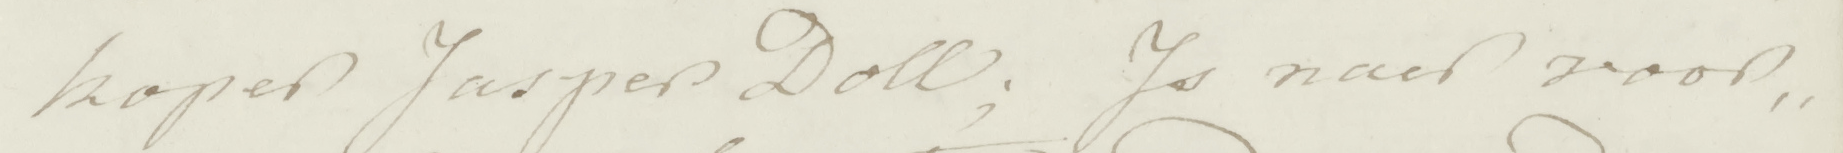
koper Jasper Doll; Is naer voor„
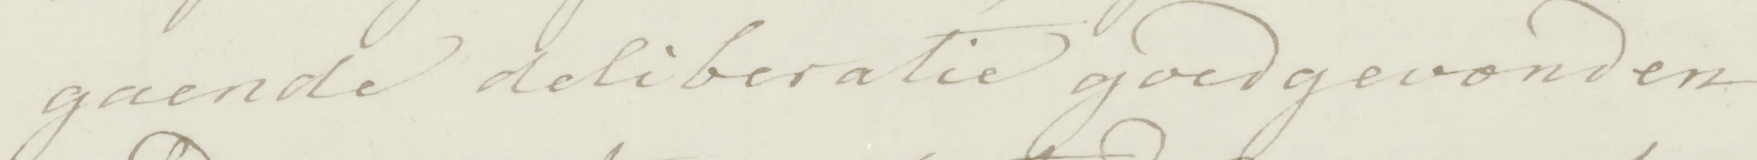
gaende deliberatie goedgevonden
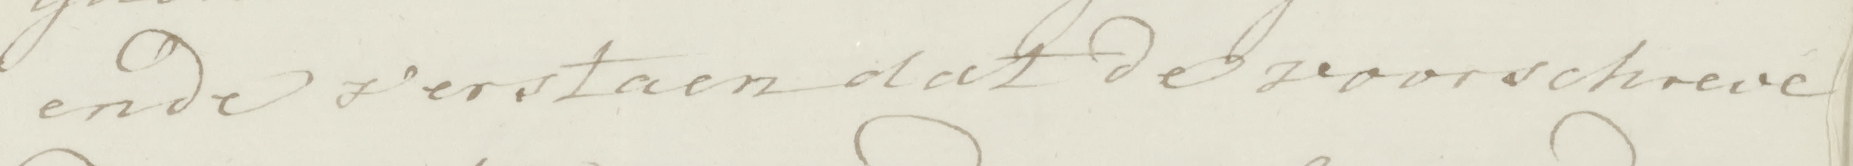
ende verstaen dat de voorschreve
